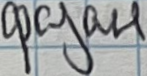фазан
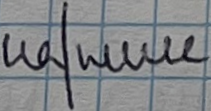карлик
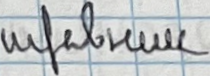травник
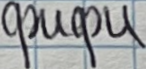фифи
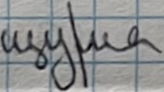щурка
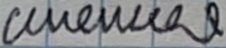степная
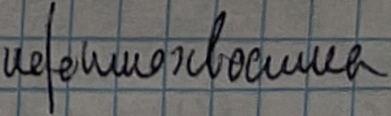короткохвостка
